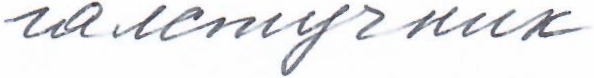галстучник
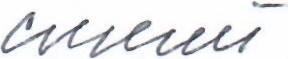синий
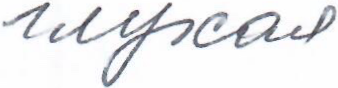глухая
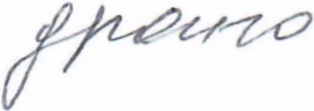дронго
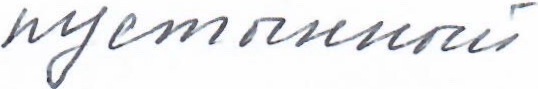пустынный
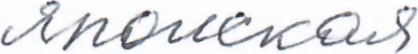японская
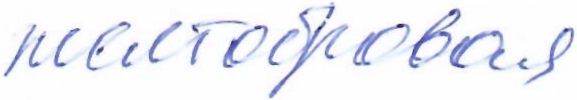желтобровая
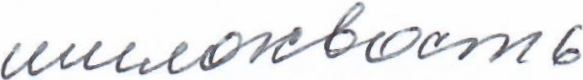шилохвость
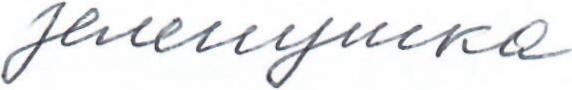зеленушка
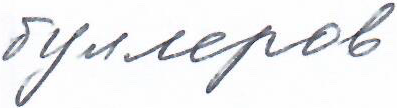буллеров
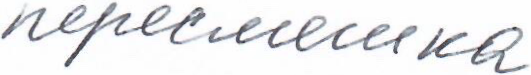пересмешка
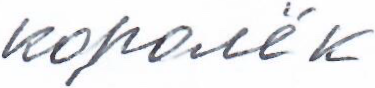королёк
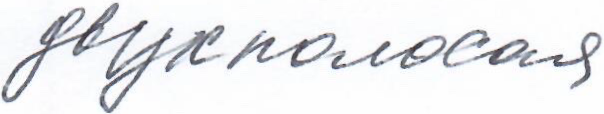двухполосая
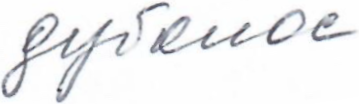дубонос
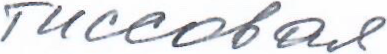тиссовая
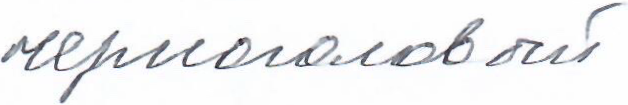черноголовый
